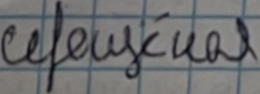серощёкая
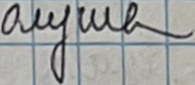олуша
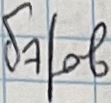бэров
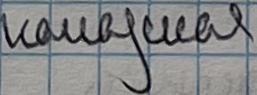канадская
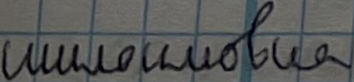шилоклювка
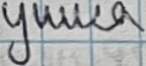утка
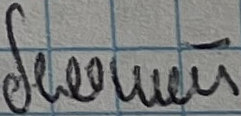белошей
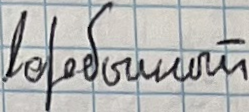воробьиный
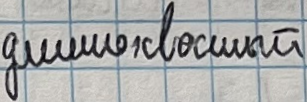длиннохвостый
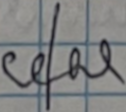серая
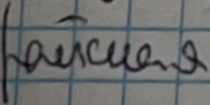райская
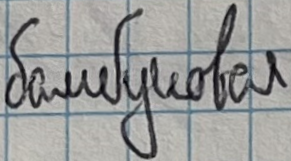бамбуковая
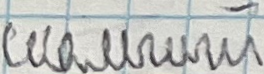скальный
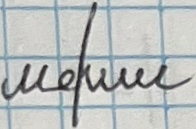люрик
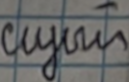сизый
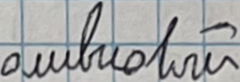оливковый
